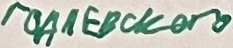годлевского
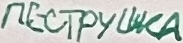пеструшка
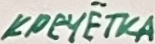кречётка
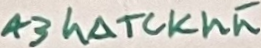азиатский
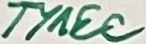тулес
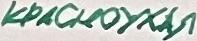красноухая
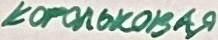корольковая
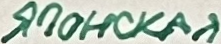японская
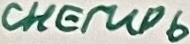снегирь
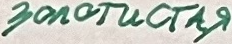золотистая
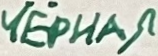чёрная
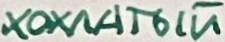хохлатый
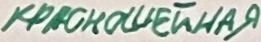красношейная
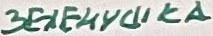зеленушка
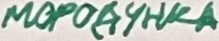мородунка
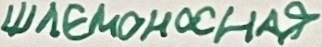шлемоносная
